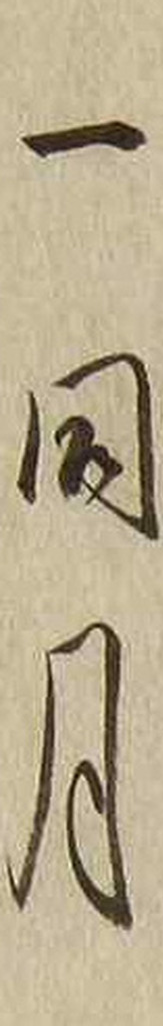一同月
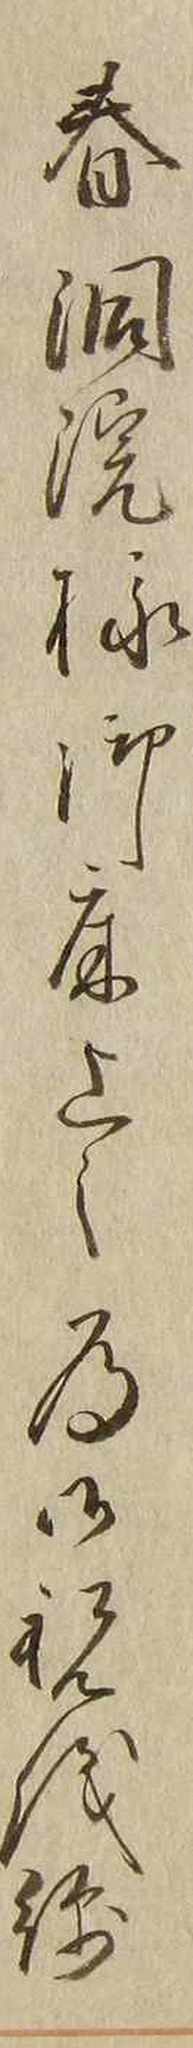春洞院様御床上之為御祝儀綿
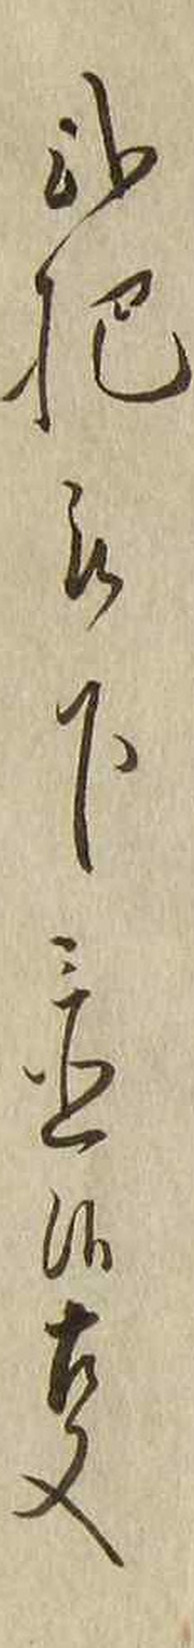弐把被下置候事

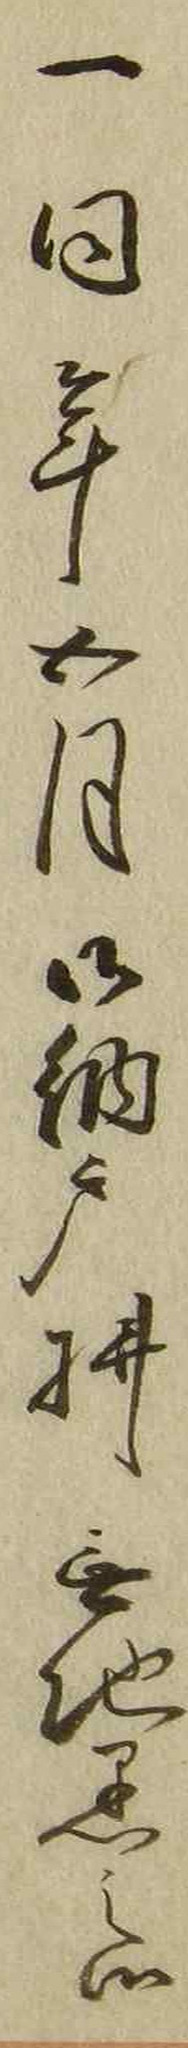一同年五月御納戸掛無地黒之御
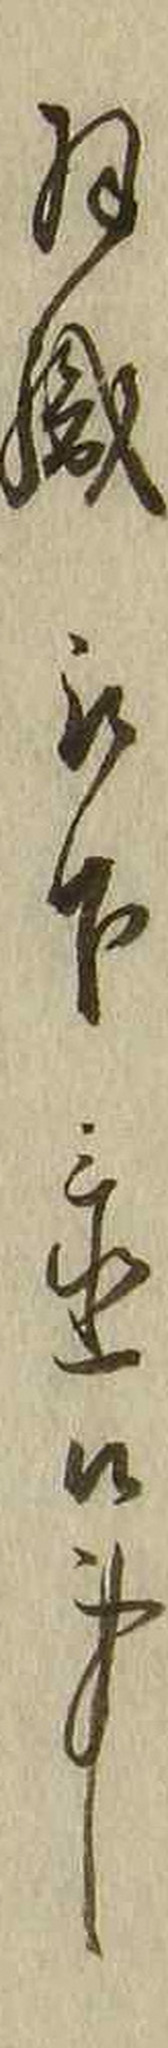羽織被下置候事
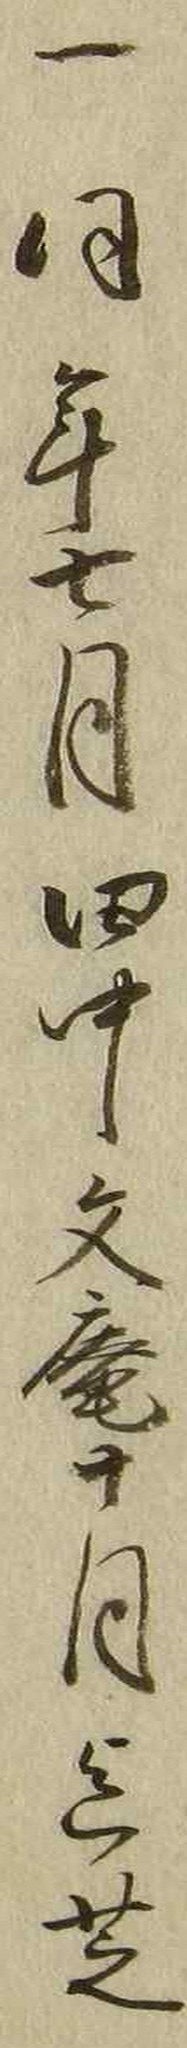一同年七月田中文庵十月迄芝
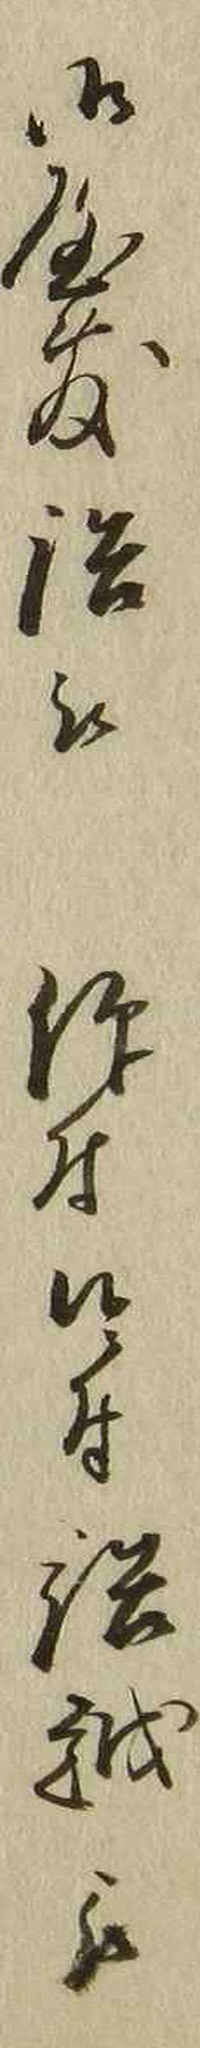御屋敷詰被仰付候ニ付詰越被
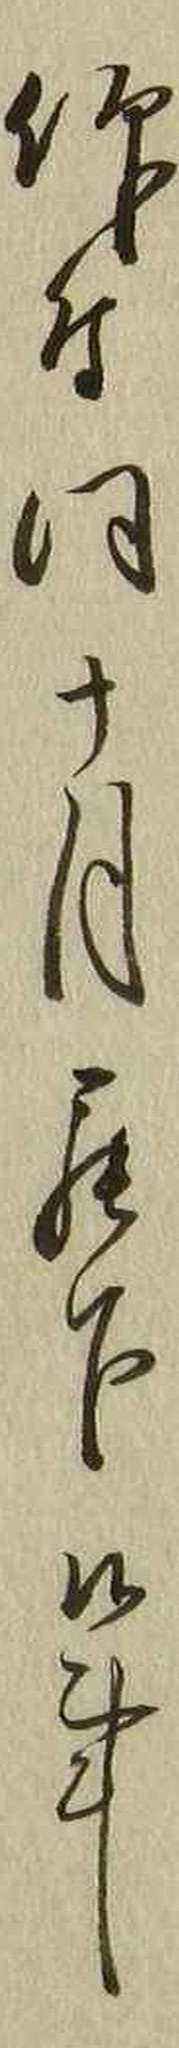仰付同十月罷下候事
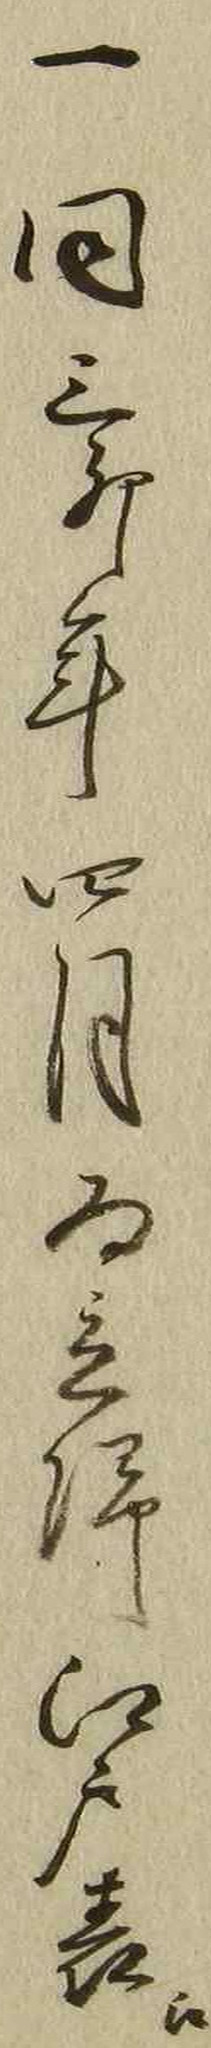一同三卯年四月為立帰江戸表江
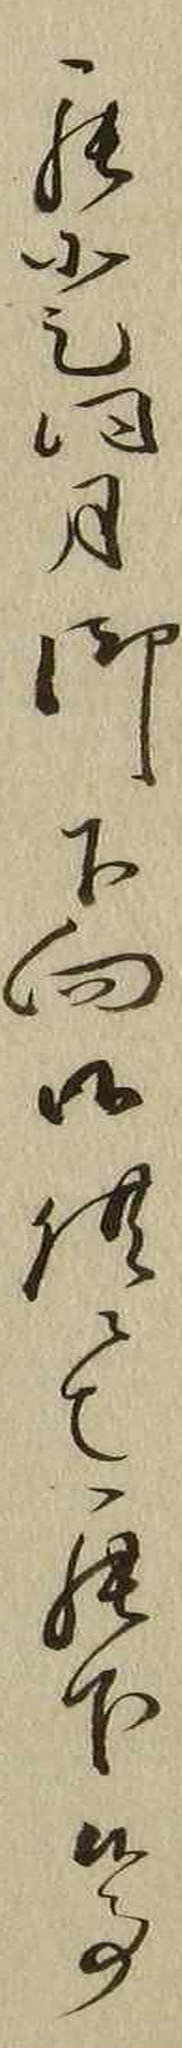罷登同月御下向御供ニて罷下候事
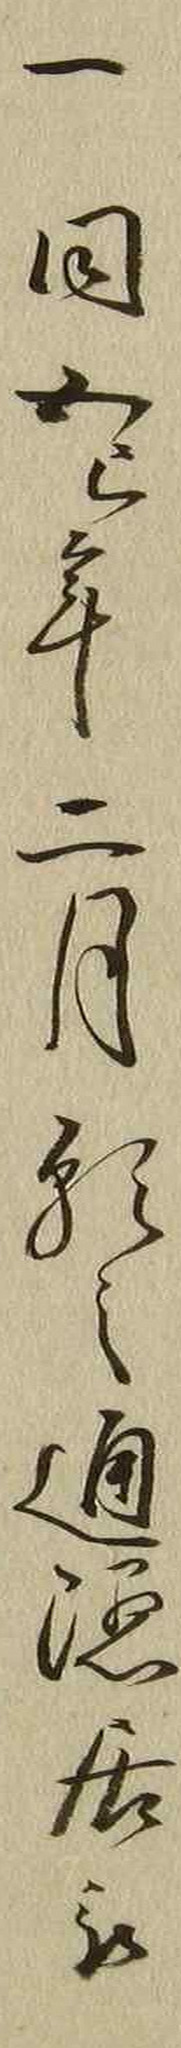一同五巳年二月願之通隠居被
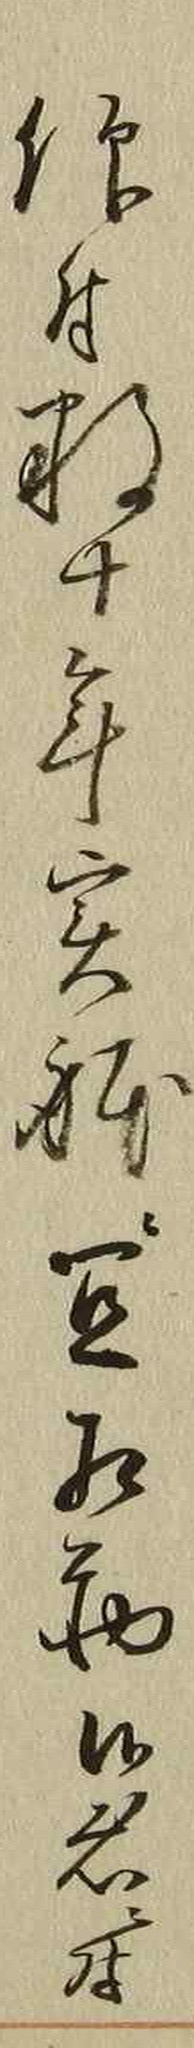仰付数十年実躰ニ宜相勤候者ニ付
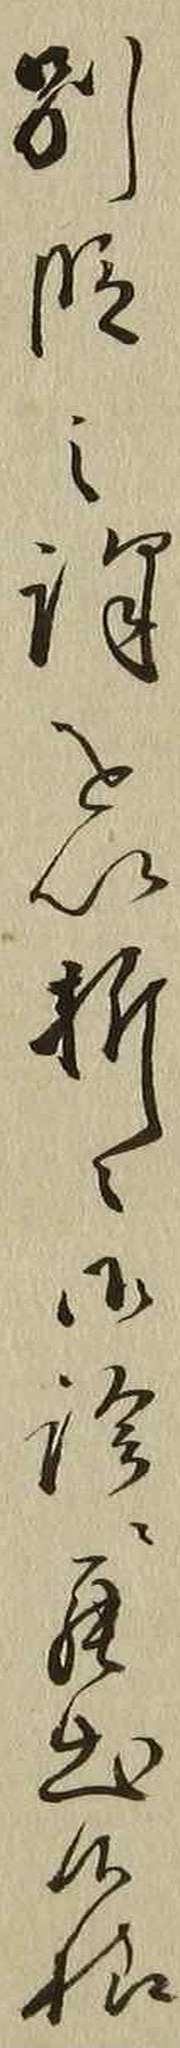別段之訳を以折々御診ニ罷出候様
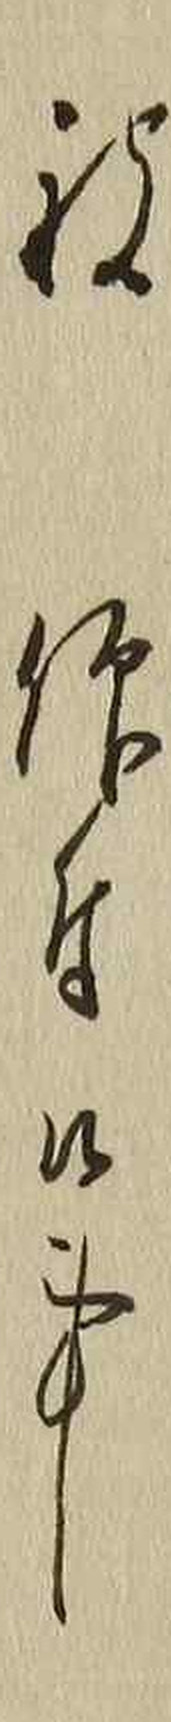被仰付候事
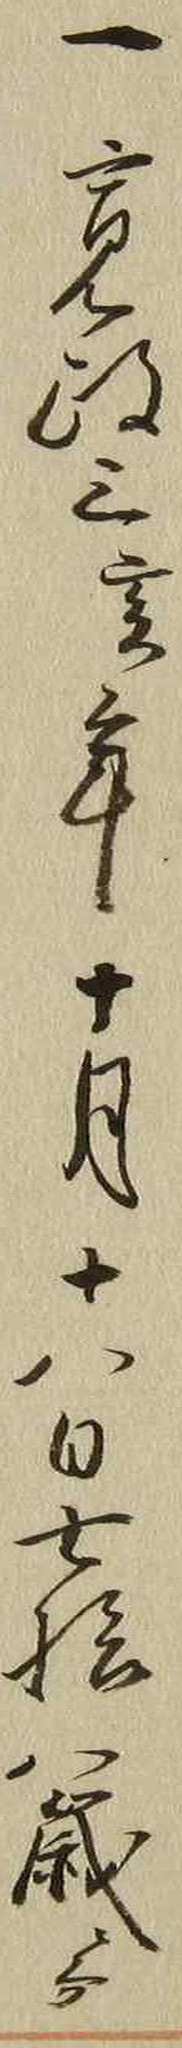一寛政三亥年十月十八日七拾八歳ニ而
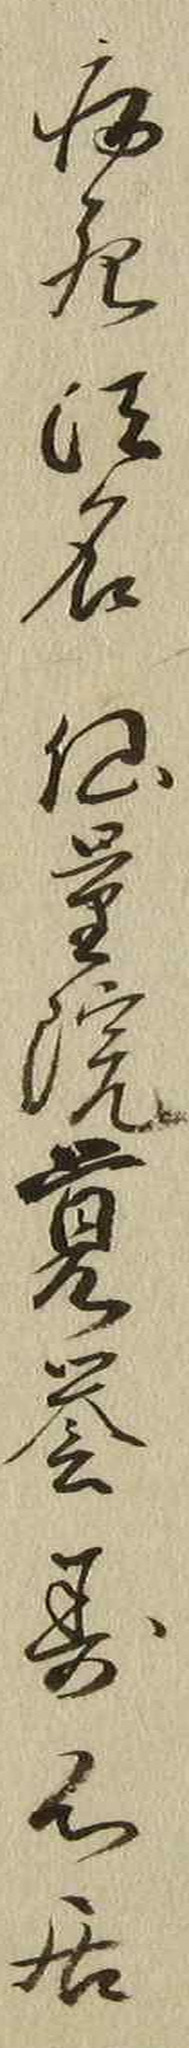病死法名仙量院覚誉寿心居
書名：諸士系譜　巻之68　を之部2
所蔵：会津若松市立会津図書館
